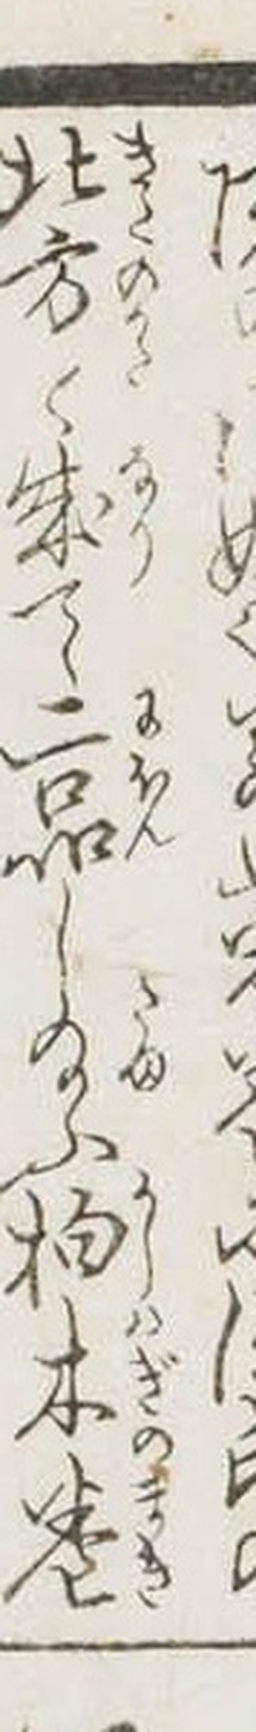北方と成て二品し給ふ柏木巻
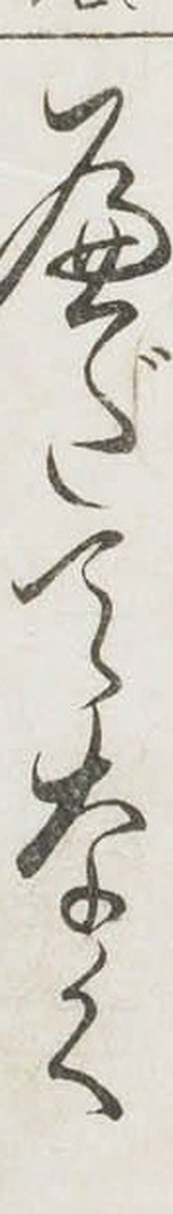へだてなく
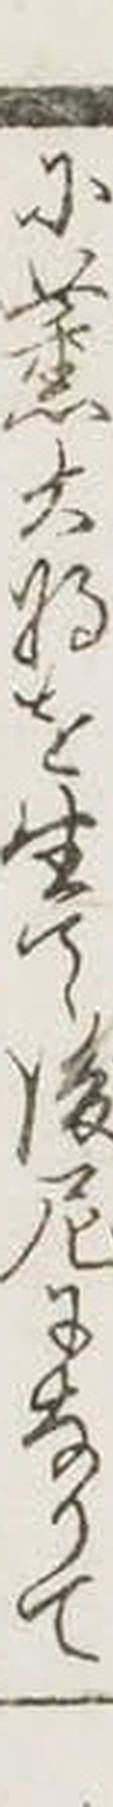に薫大将を生て後尼になりて
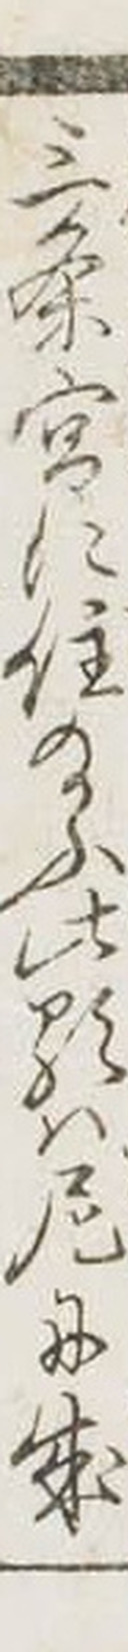三条宮に住給ふ此歌は尼に成
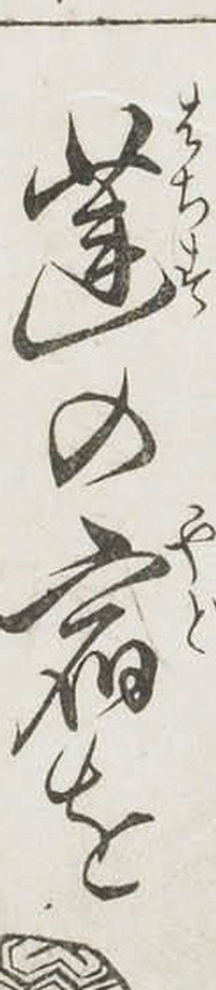蓮の宿を
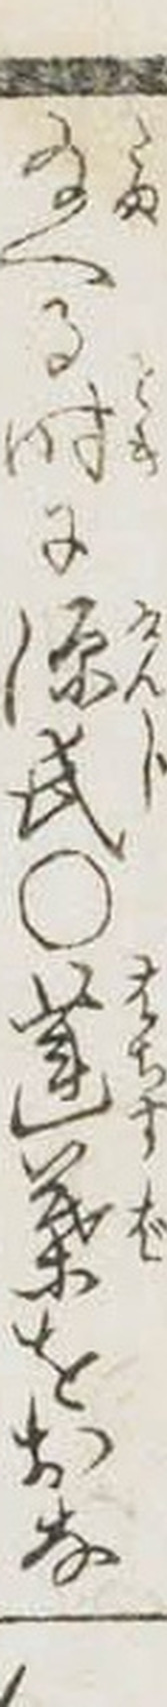給へる時に源氏○蓮葉をおな
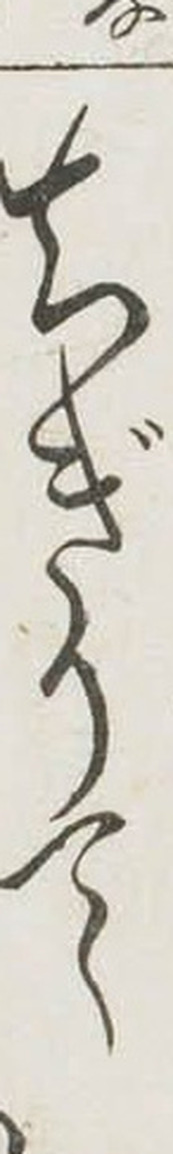ちぎりて
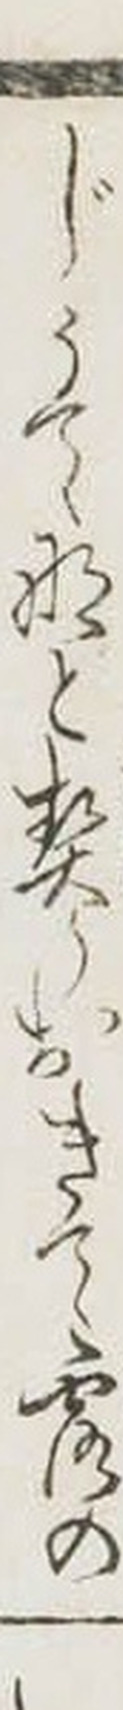じうてなと契りおきて露の
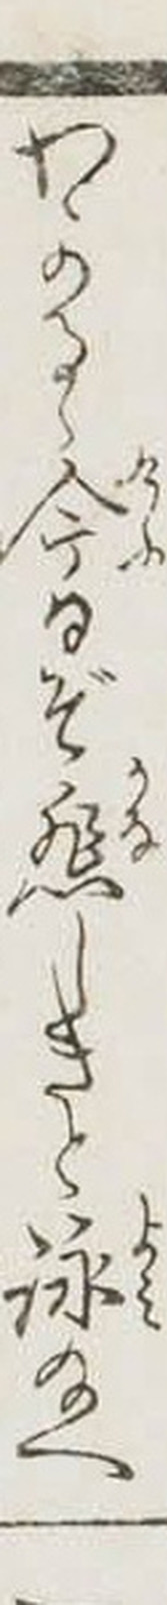わかるゝ今日ぞ悲しきと詠給へ
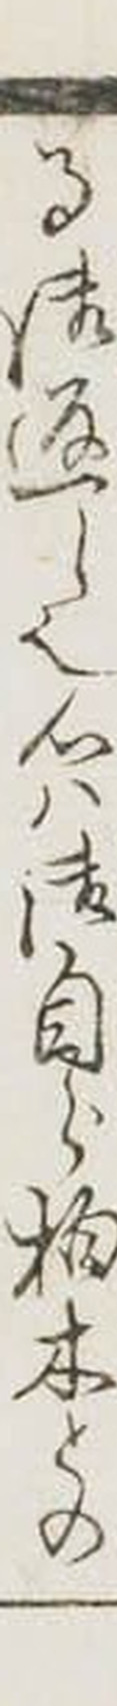る御返し也心は御自ら柏木との
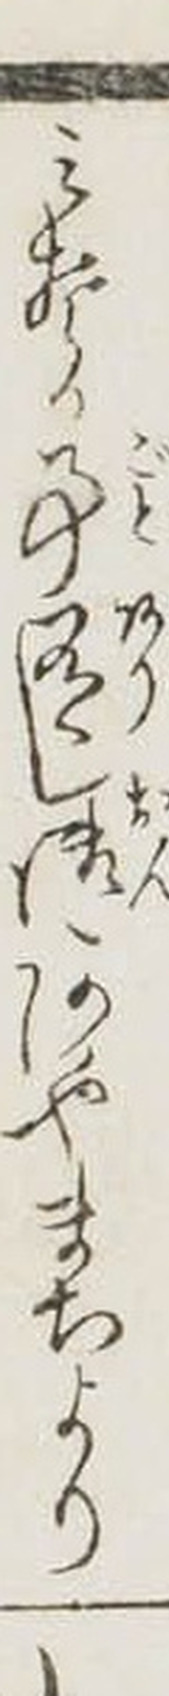みそか事有し御あやまちより
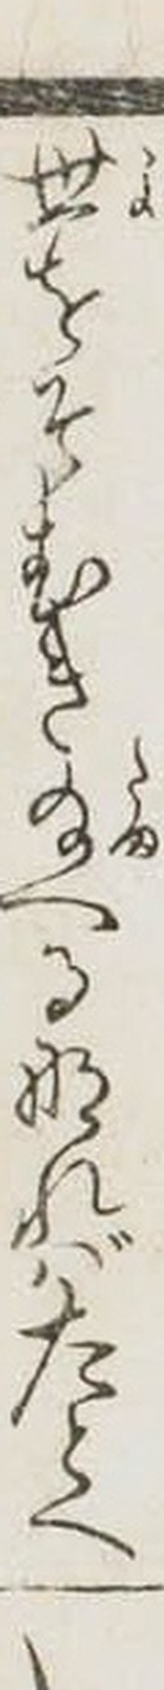世をそむき給へるなればたとへ
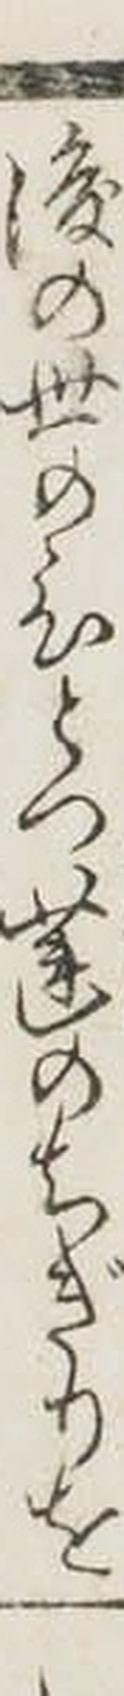後の世のひとつ蓮のちぎりを
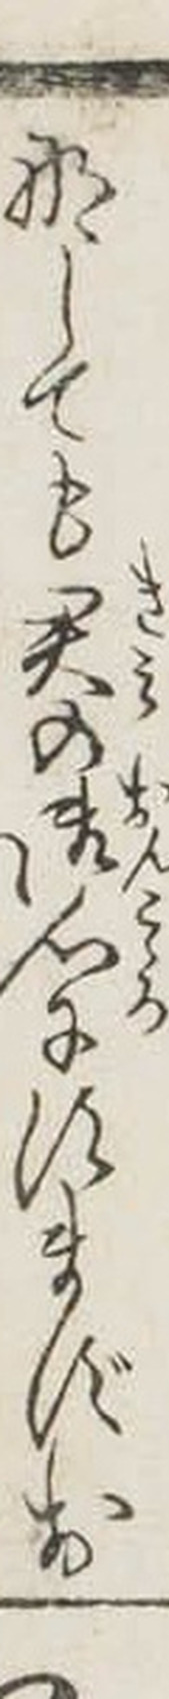なしても君の御心にすまずお
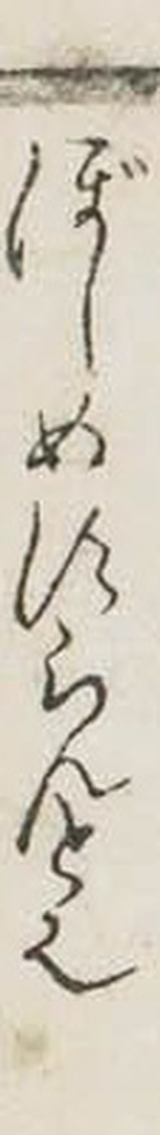ぼしめすらんと也

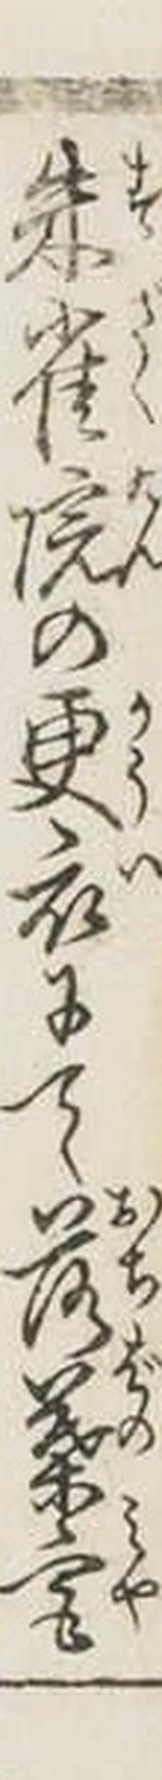朱雀院の更衣にて落葉宮
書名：源氏百人一首
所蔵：東京学芸大学教育コンテンツアーカイブ
